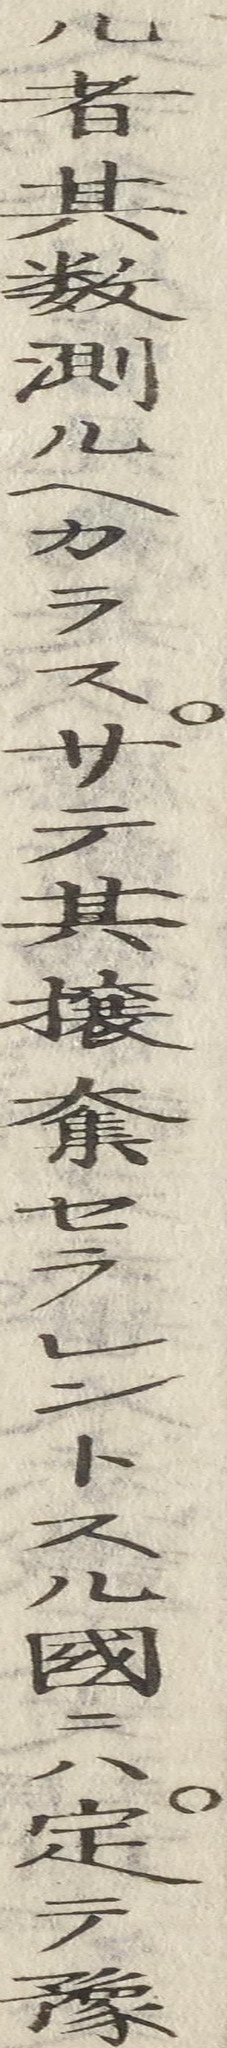ル者其数測ルヘカラス。サテ其攘奪セラレントスル国ニハ。定テ予
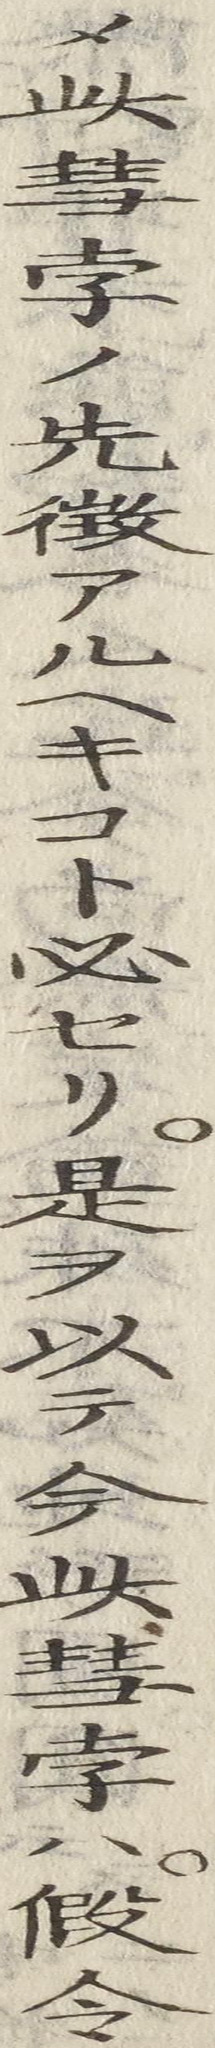メ此彗孛ノ先徴アルヘキコト必セリ。是ヲ以テ今此彗孛ハ。仮令
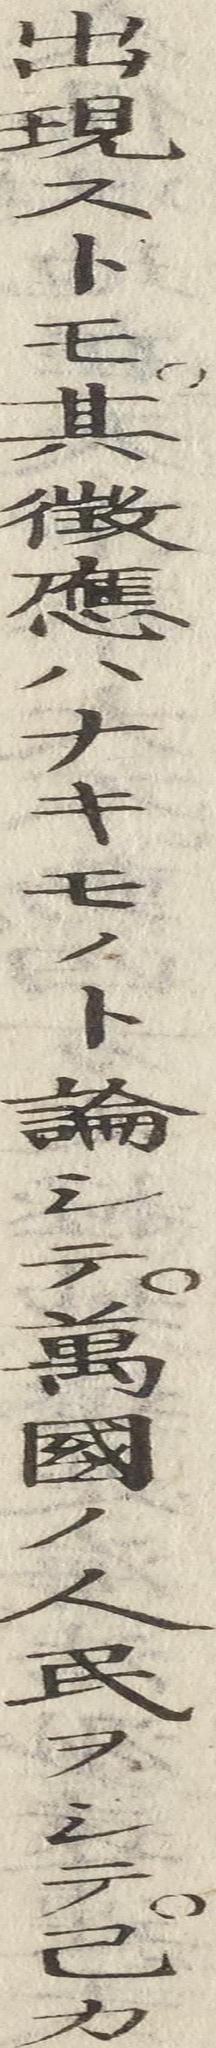出現ストモ。其徴応ハナキモノト論シテ。万国ノ人民ヲシテ。己カ
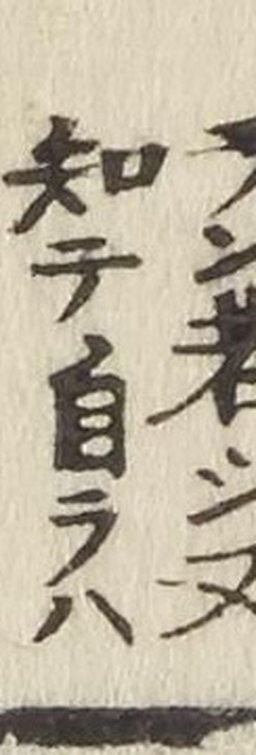知テ自ラハ
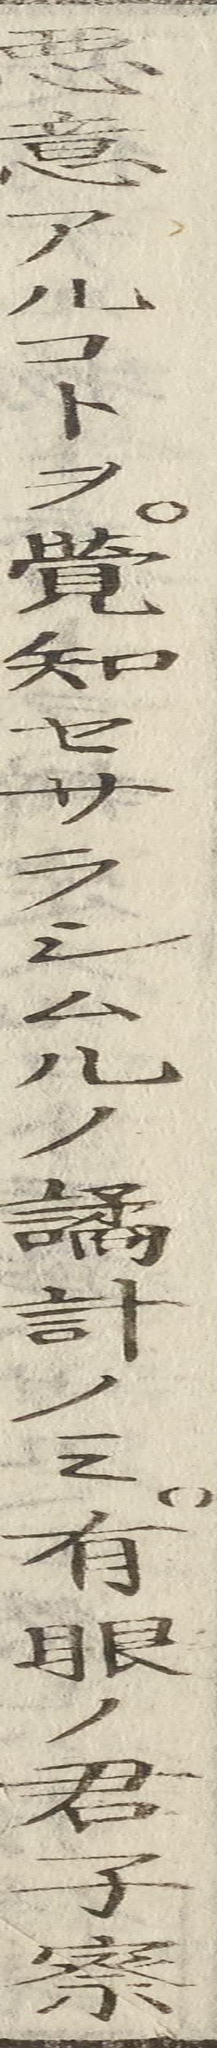悪意アルコトヲ。覚知セサラシムルノ譎計ノミ。有眼ノ君子察
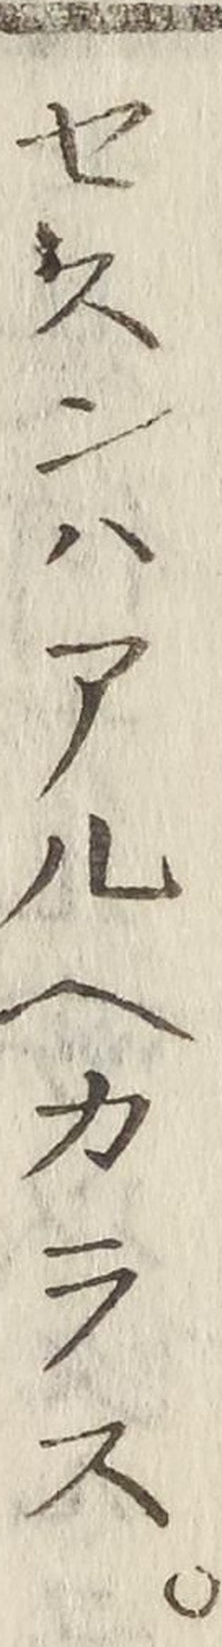セスンハアルヘカラス。
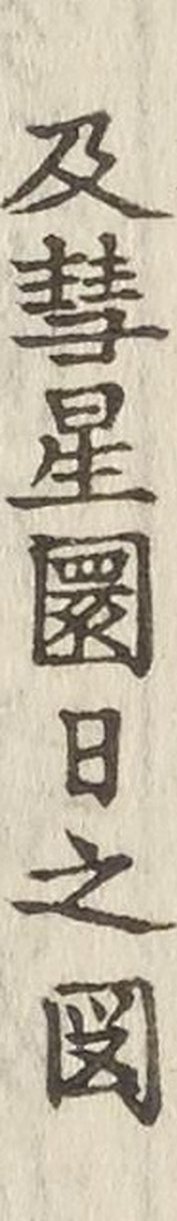及彗星圜日之図

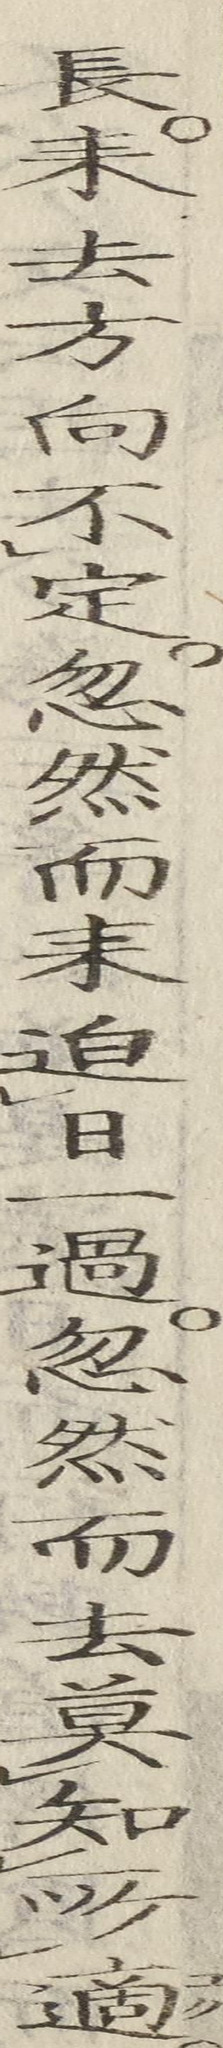長。来去方向不定。忽然而来迫日一過。忽然而去莫知所適。
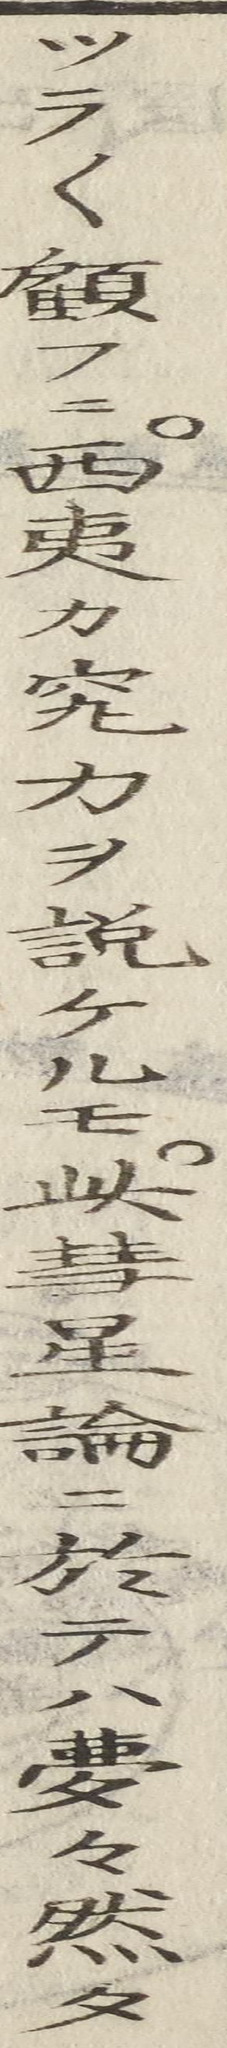ツラ〳〵顧フニ。西夷カ究カヲ説ケルモ。此彗星論ニ於テハ夢々然タ
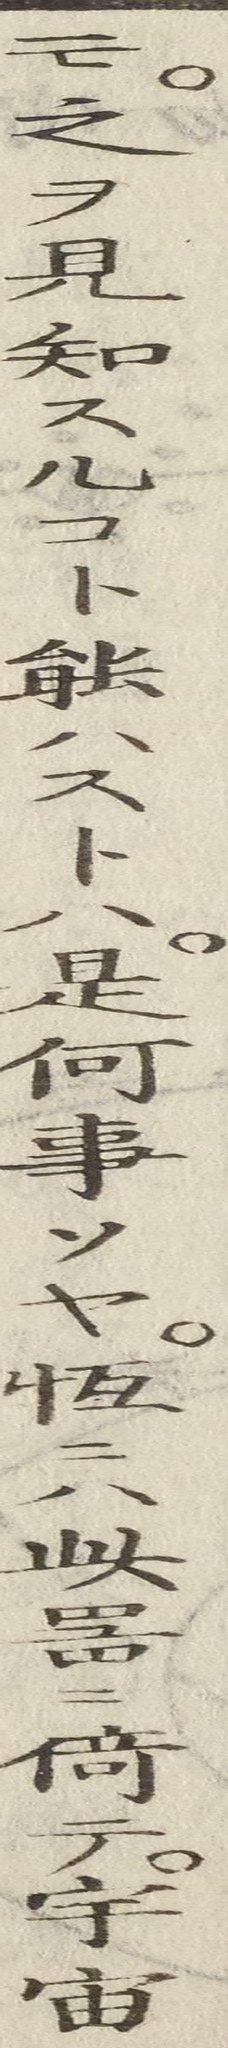モ。之ヲ見知スルコト能ハストハ。是何事ソヤ。恆ニハ此器ニ倚テ。宇宙
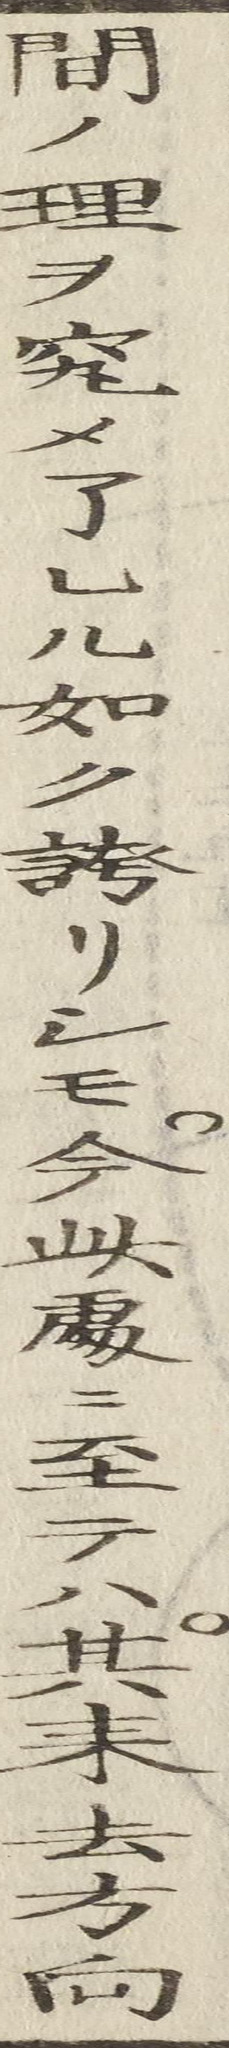間ノ理ヲ究メ了レル如ク誇リシモ。今此処ニ至テハ。其来去方向
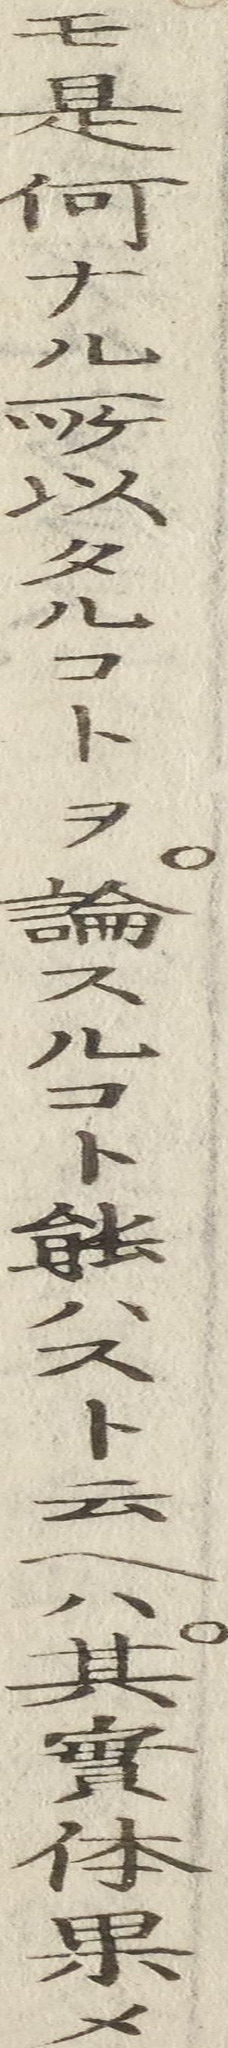モ是何ナル所以タルコトヲ。論スルコト能ハスト云ヘハ。其実体果シテ
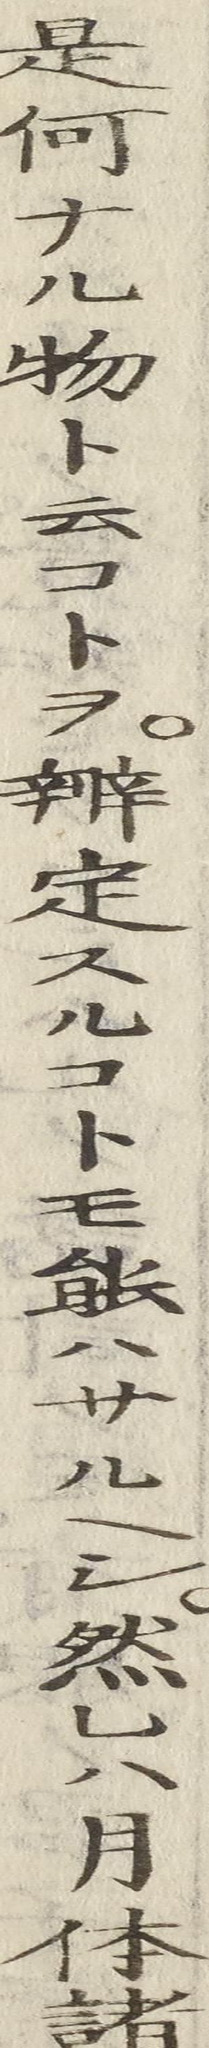是何ナル物ト云コトヲ。弁定スルコトモ能ハサルヘシ。然レハ月体諸
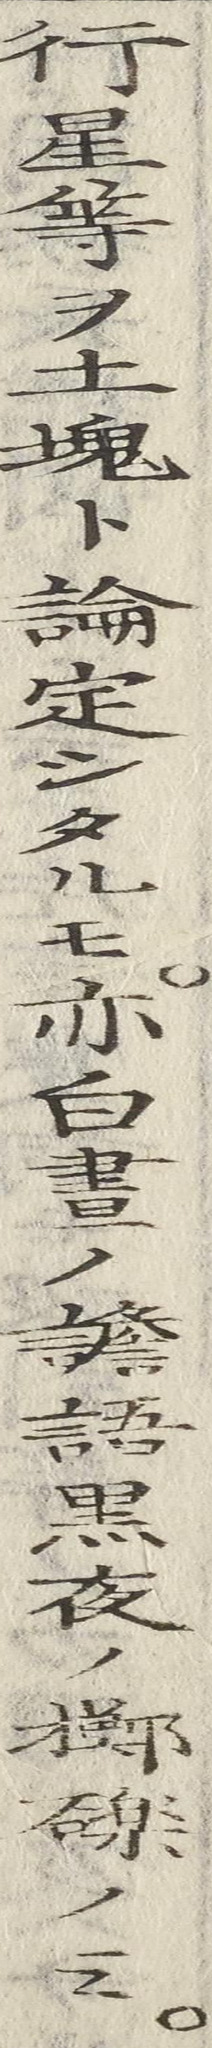行星等ヲ土塊ト論定シタルモ。亦白昼ノ譫語黒夜ノ擲礫ノミ。
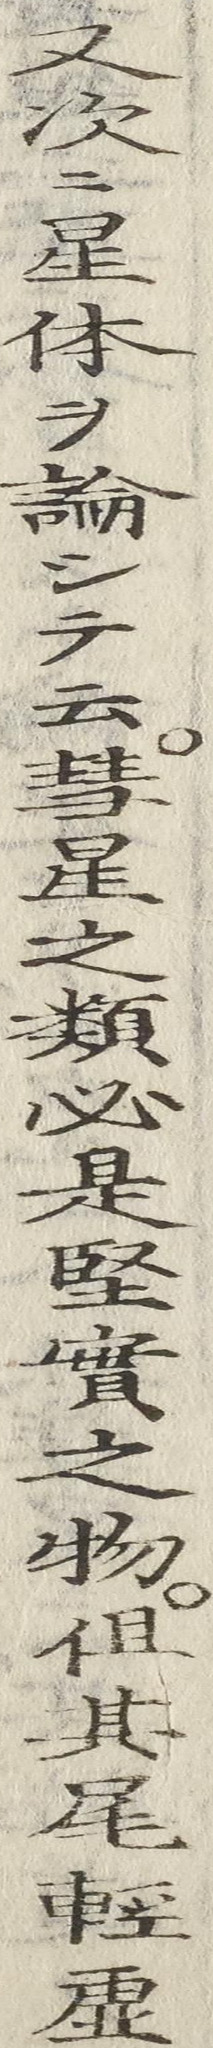又次ニ星体ヲ論シテ云。彗星之類必是堅実之物。但其尾軽虚
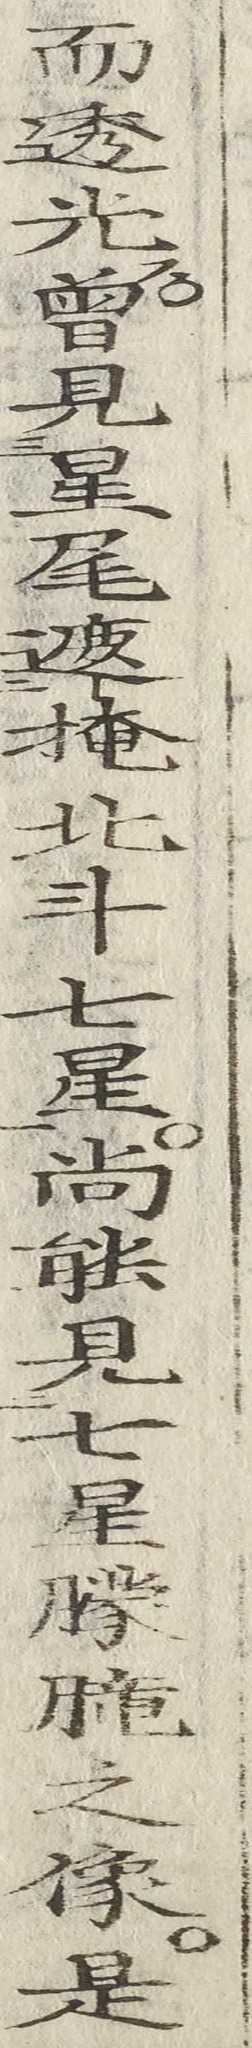而透光。曾見星尾遮掩北斗七星。尚能見七星朦朧之像。是
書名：護法新論　中
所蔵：東京大学地震研究所図書室 Earthquake Research Institute Library, The University of Tokyo, JAPAN
